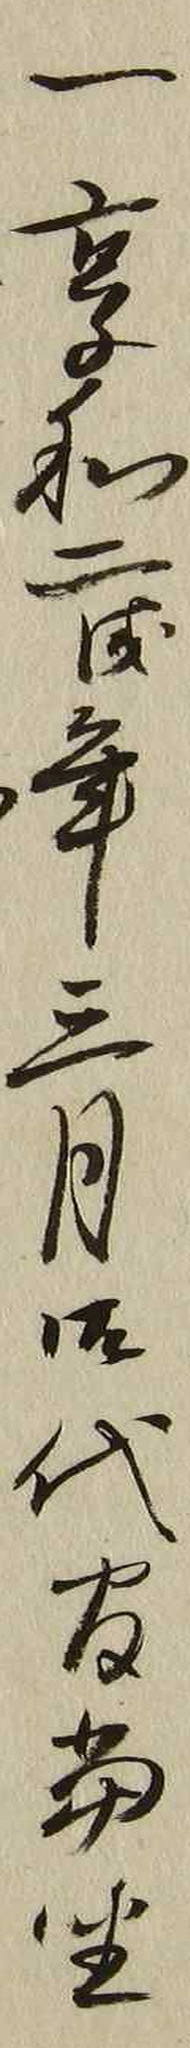一享和二戌年三月御代官当坐
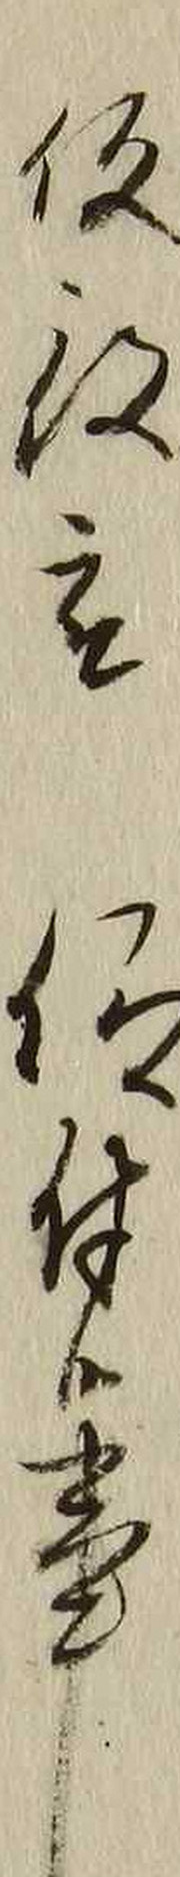仮役被仰付候事
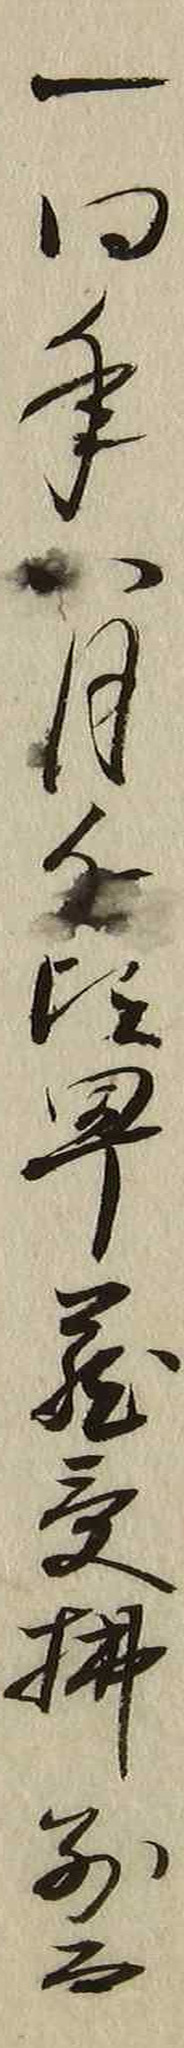一同年八月近頃町蔵受払別而
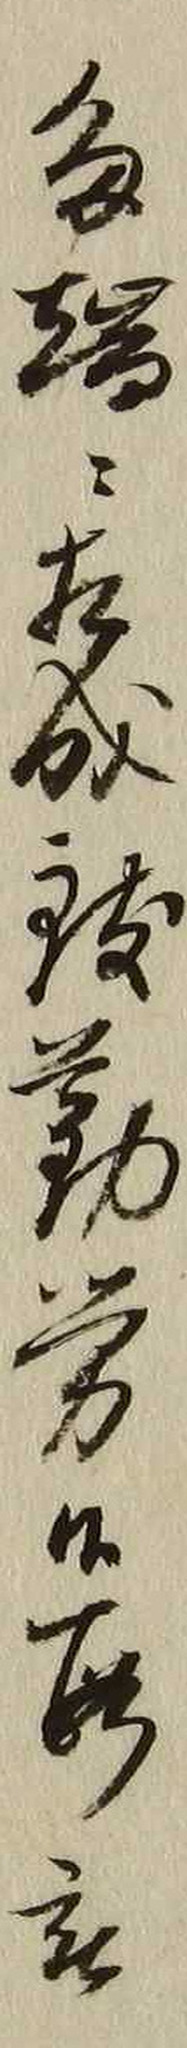多端ニ相成致勤労候段被
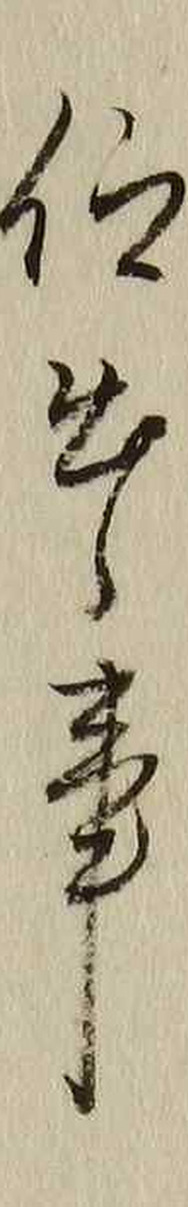仰出候事
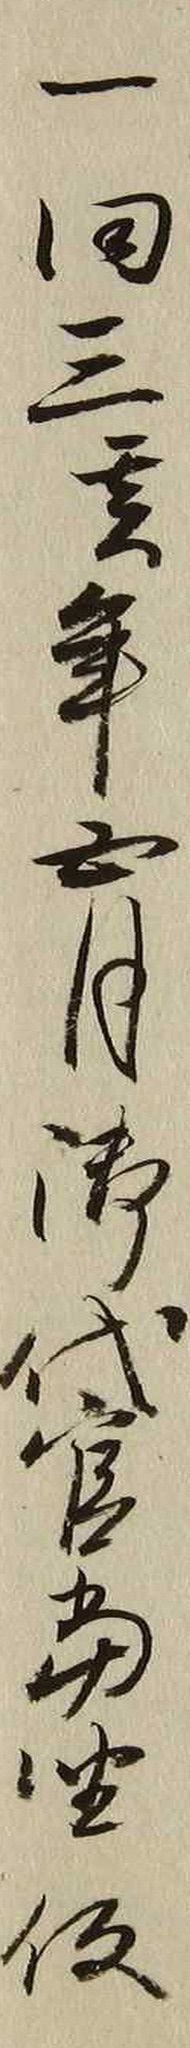一同三亥年五月御代官当坐仮
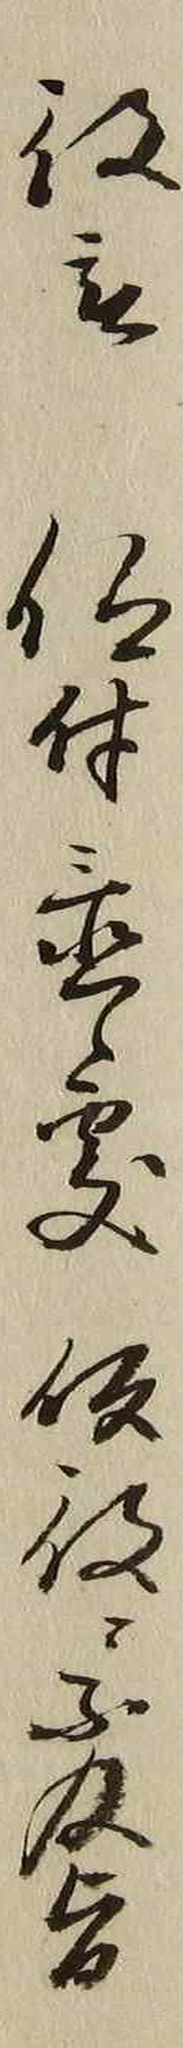役被仰付置候処仮役ニ不及旨
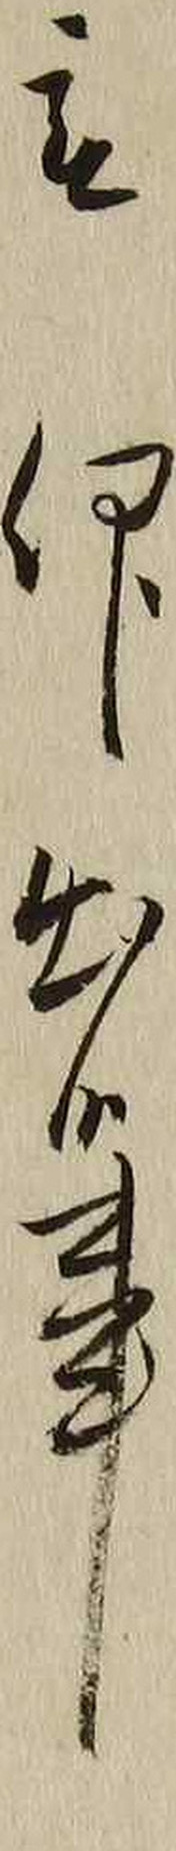被仰出候事
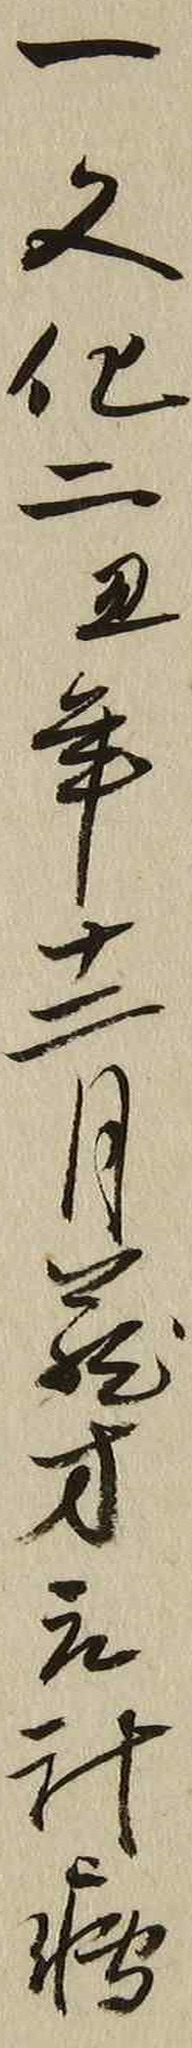一文化二丑年十二月蔵方取計ニ転
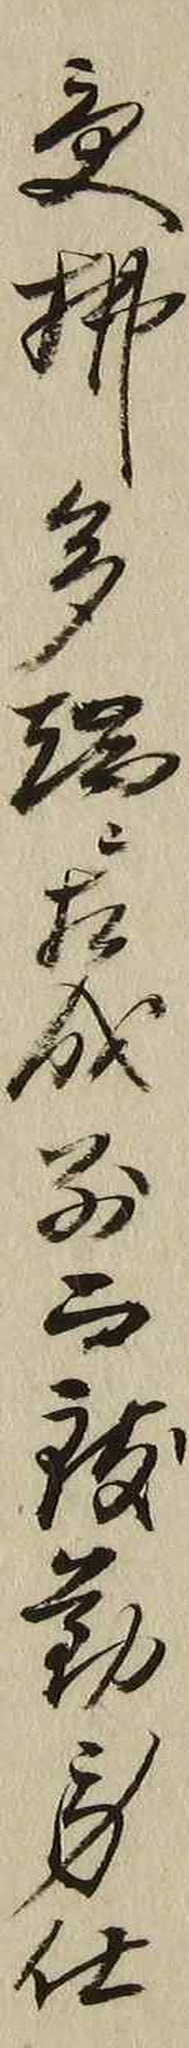受払多端ニ相成別而致勤身仕
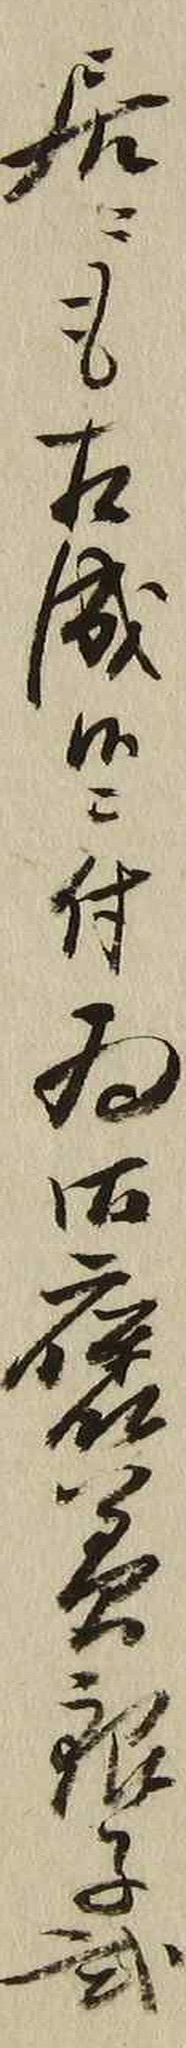居ニも相成候ニ付為御褒美銀子弐
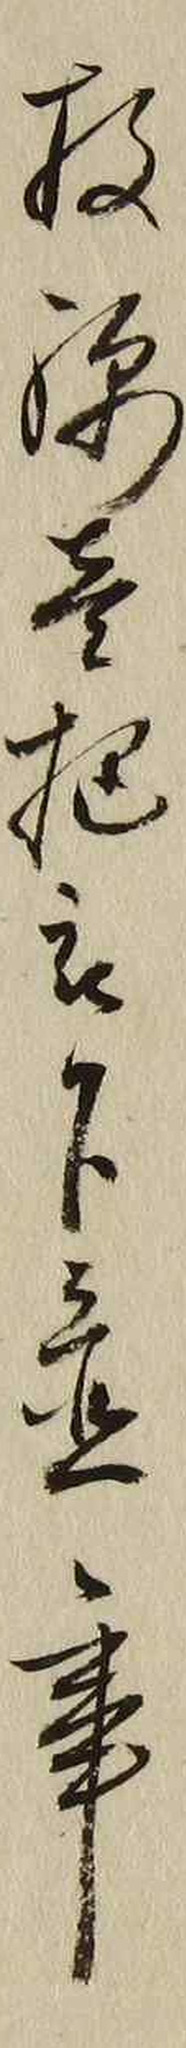枚綿壱把被下置候事
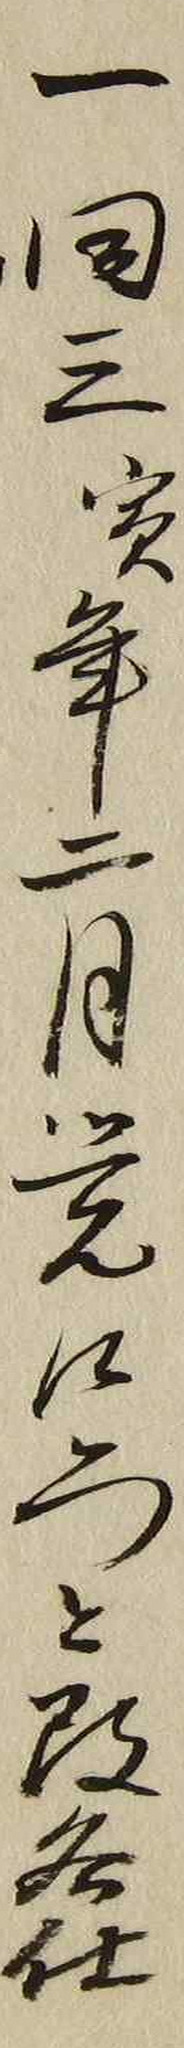一同三寅年二月覚左衛門と改名仕
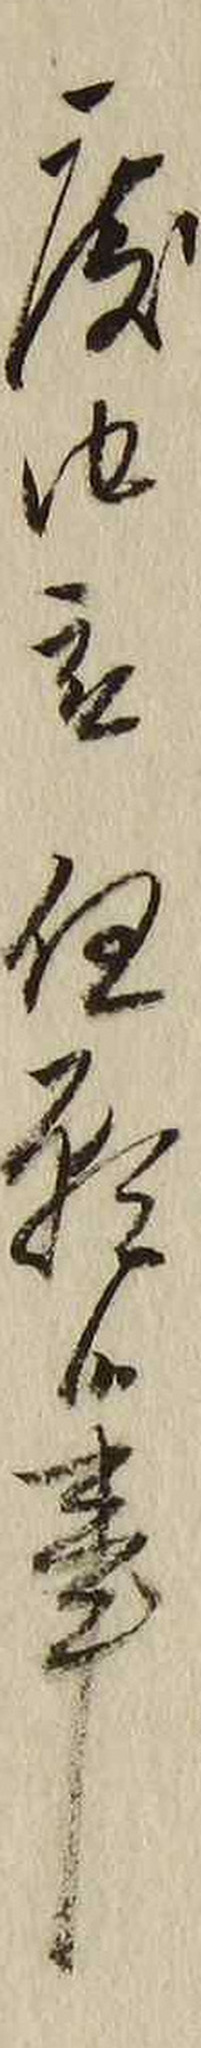度由被任願候事
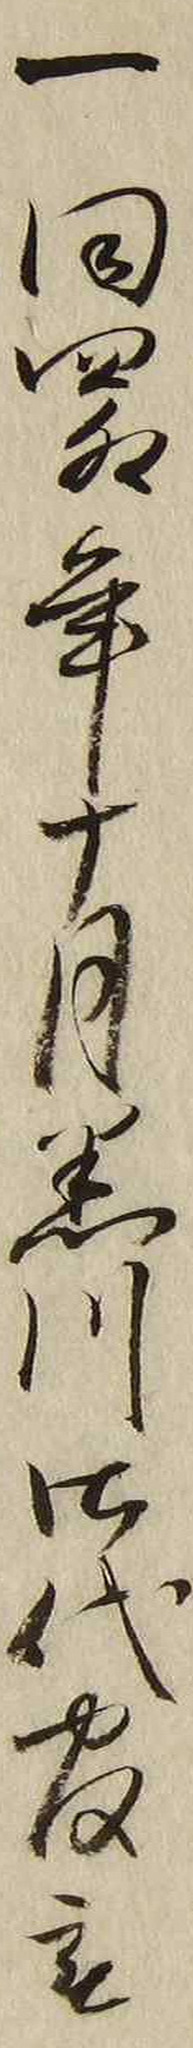一同四卯年十月黒川御代官被
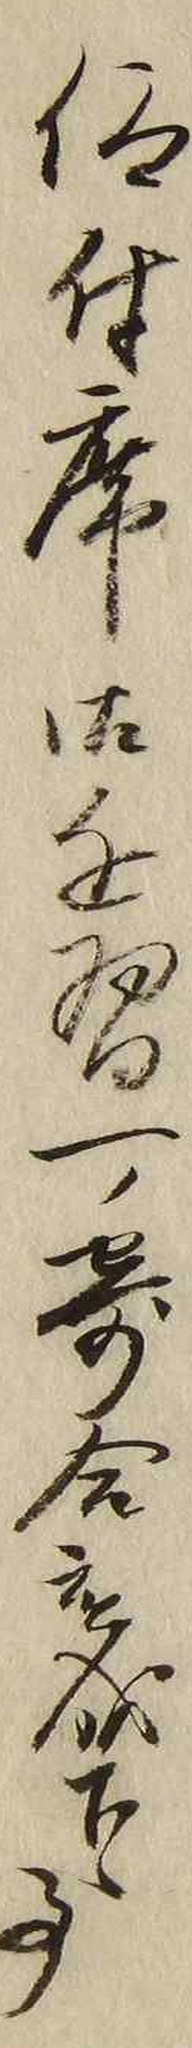仰付席御近習一ノ寄合被成下候事
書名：諸士系譜　巻之352　す之部2
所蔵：会津若松市立会津図書館
